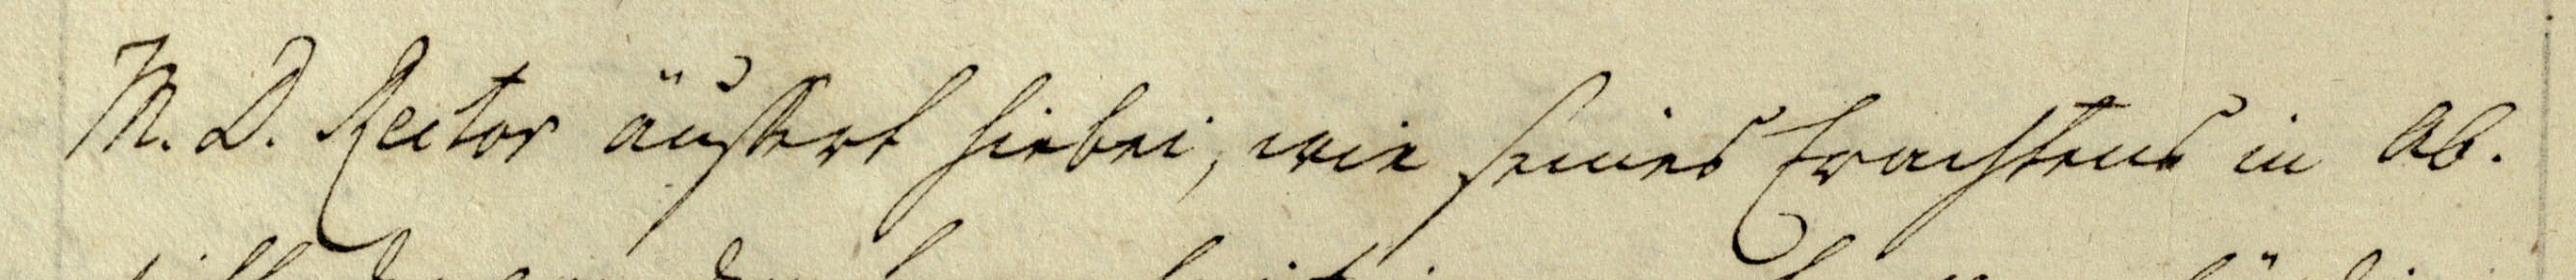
M. D. Rector äussert hiebei, wie seines Erachtens in Ab¬
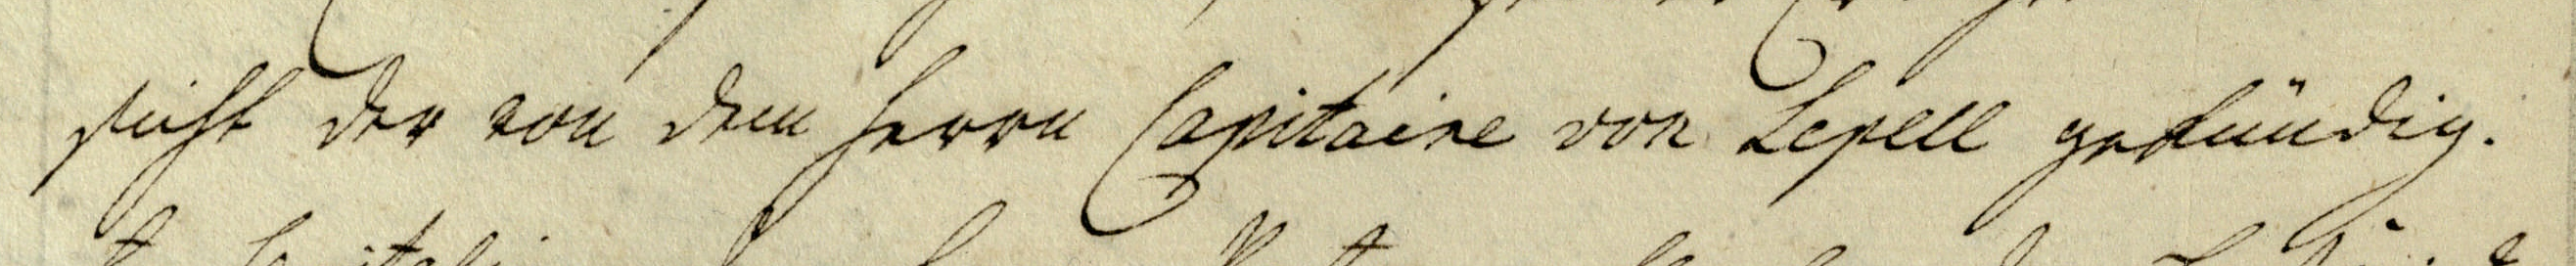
sicht der von dem Herrn Capitaine von Lepell gekündig¬
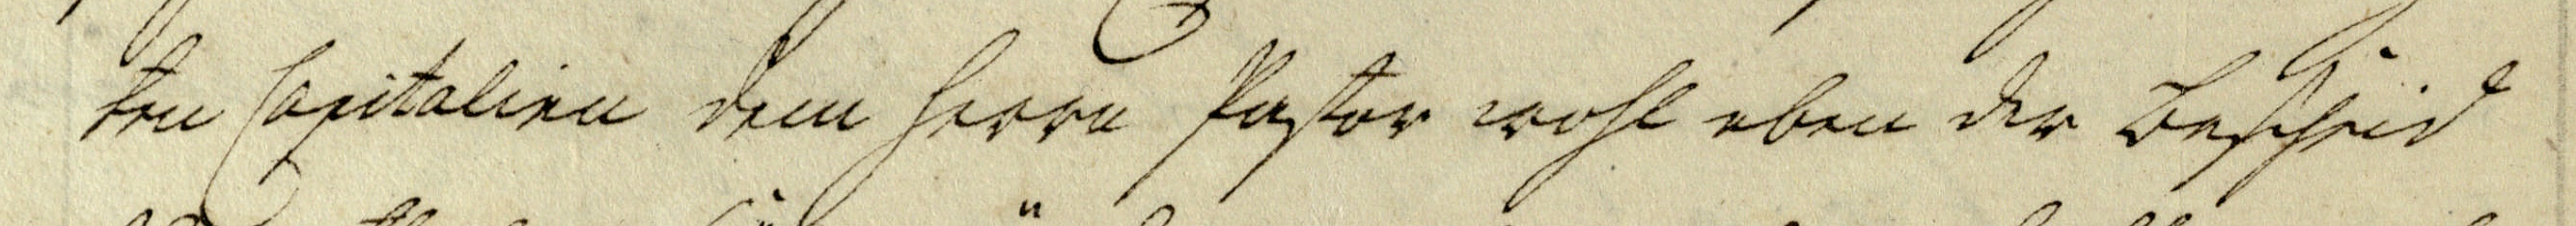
ten Capitalien dem Herrn Pastor wohl eben der Bescheid
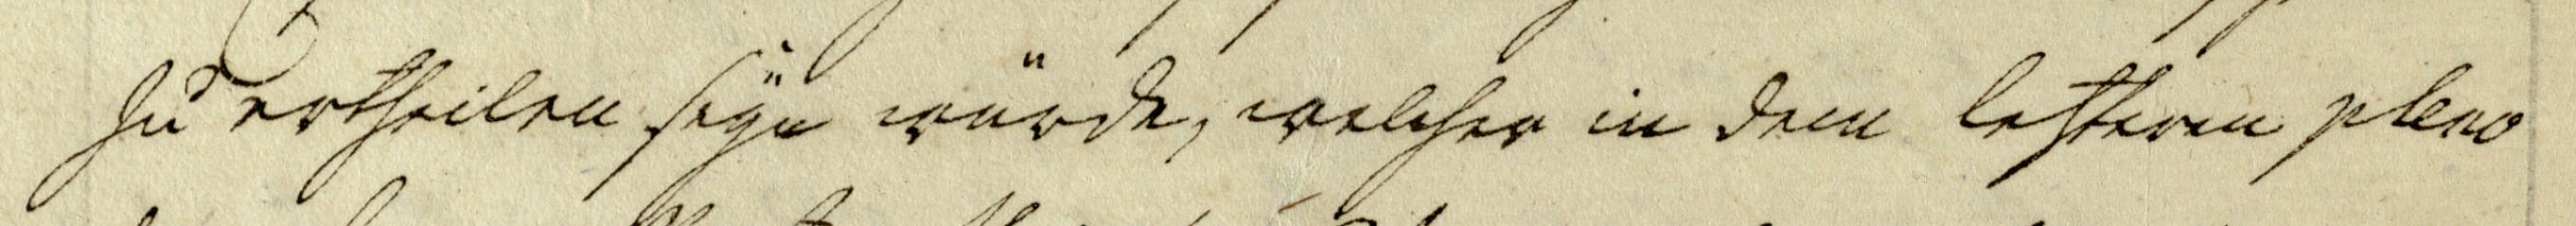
zu ertheilen seyn würde, welcher in dem letzteren pleno
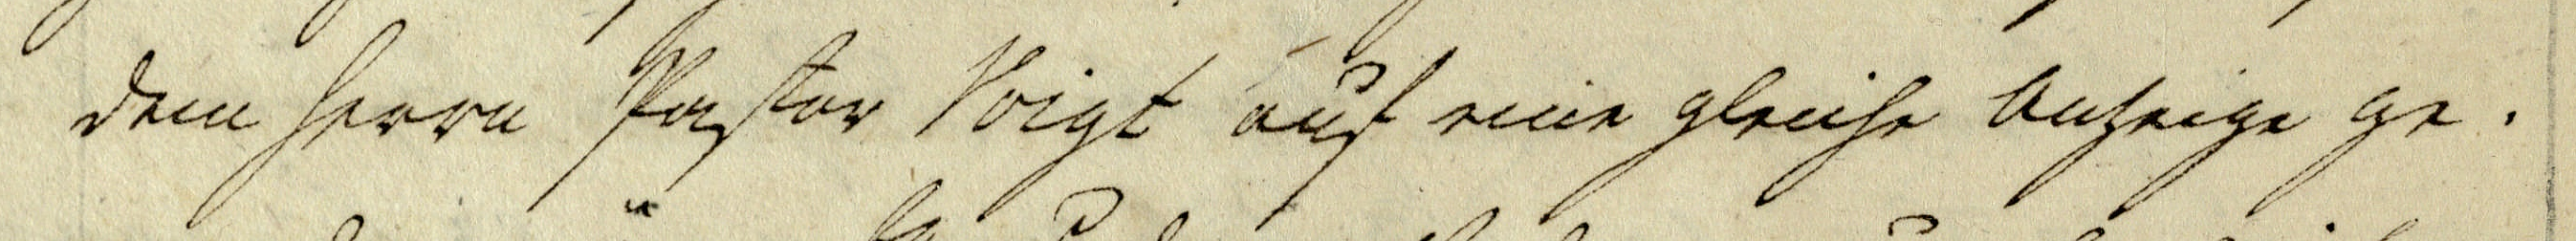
dem Herrn Pastor Voigt auf eine gleiche Anzeige ge¬
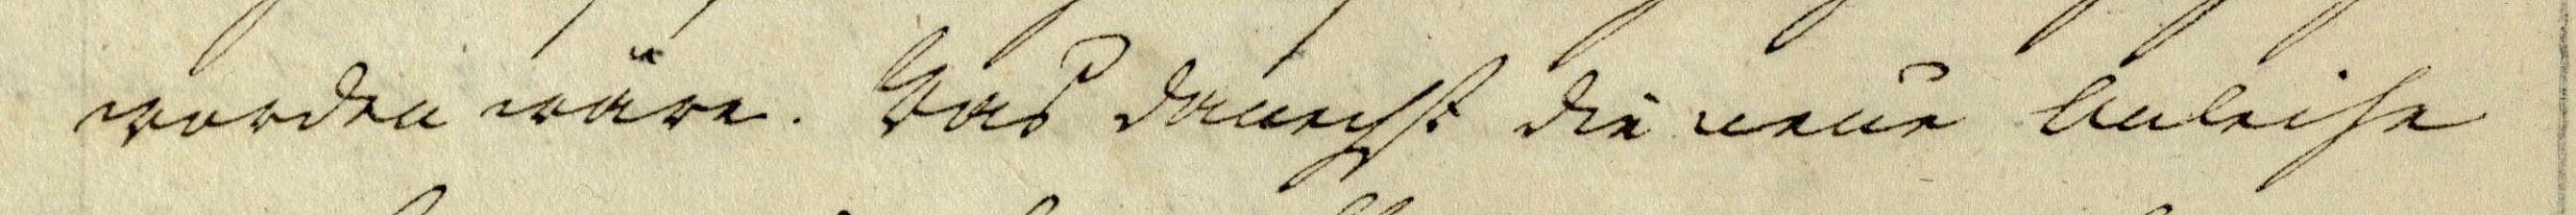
worden wäre. Was danechst die neue Anleihe
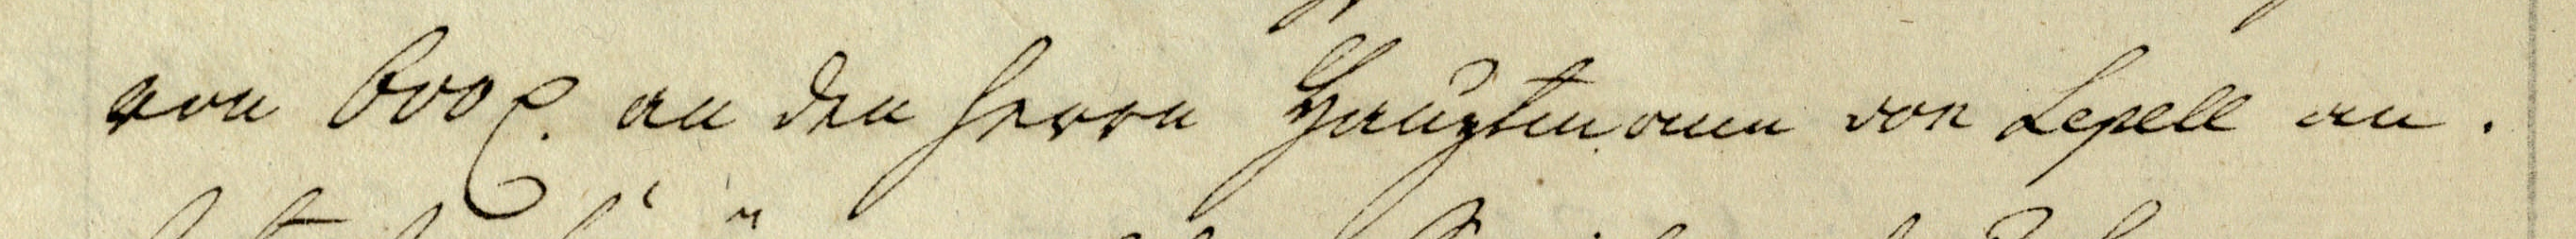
von 600 l. an den Herrn Hauptmann von Lepell an¬
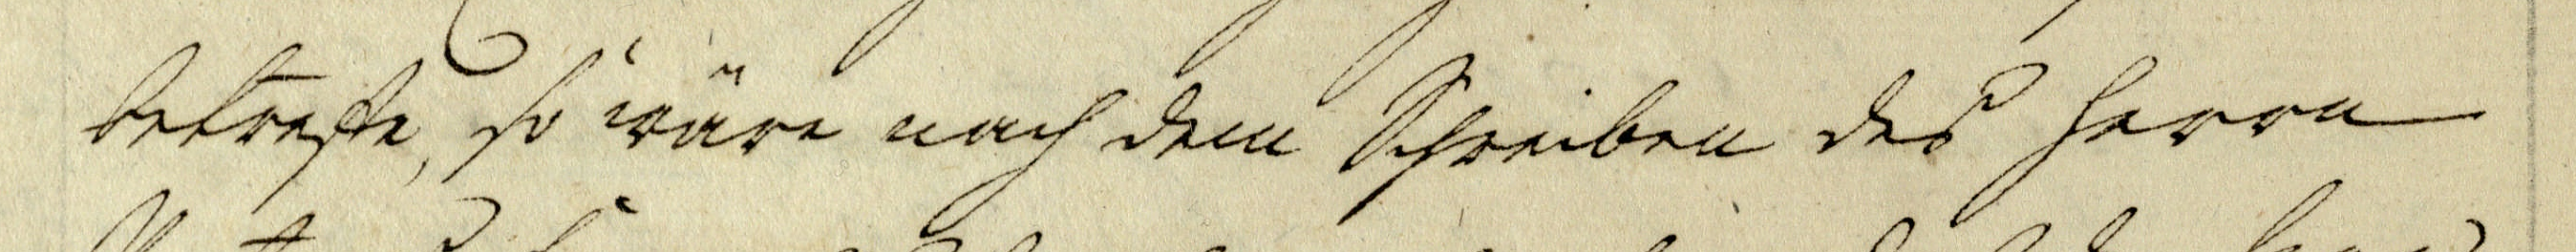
betreffe, so wäre nach dem Schreiben des Herrn
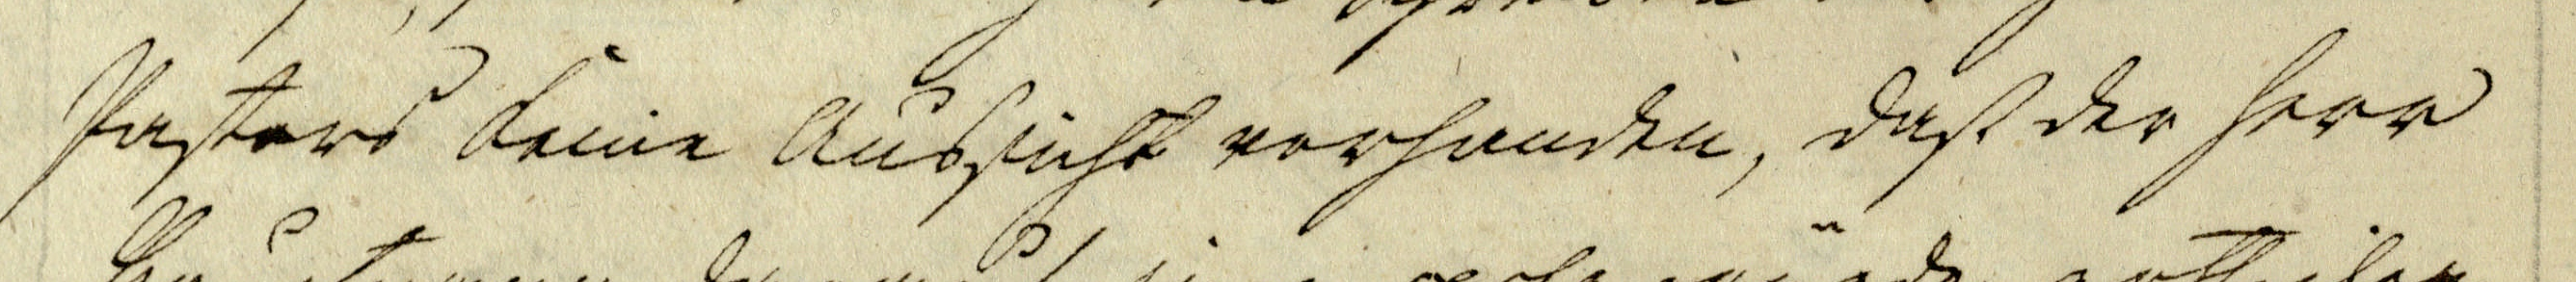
Pastors keine Aussicht vorhanden, daß der Herr
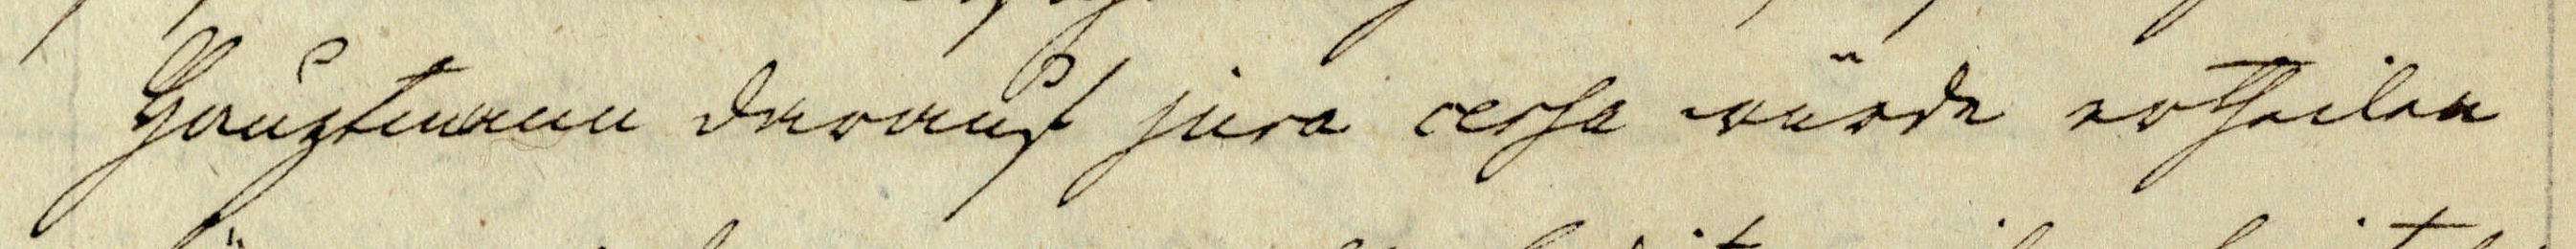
Hauptmann darauf jura cessa würde ertheilen
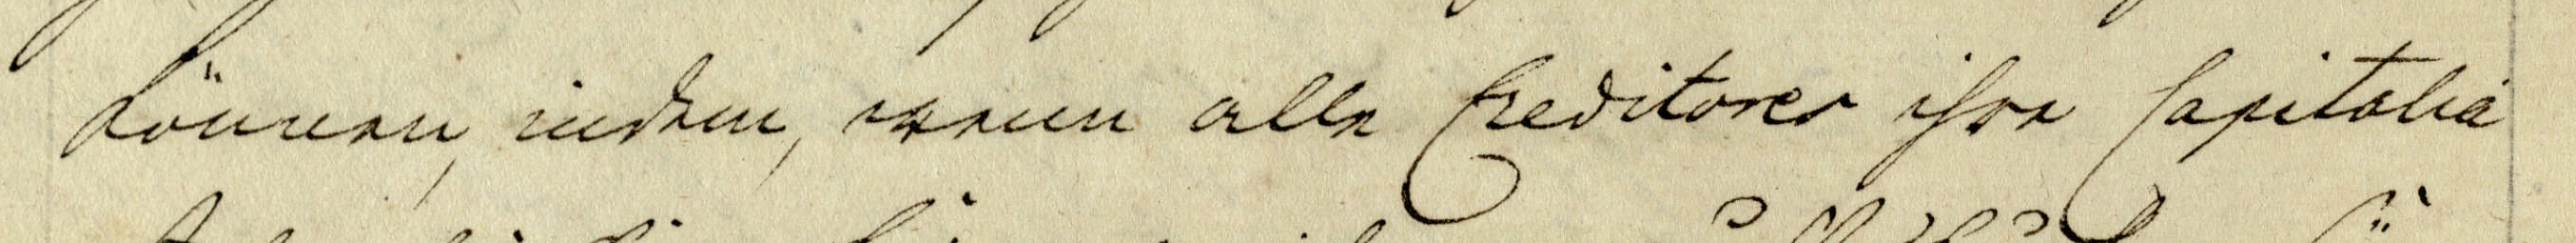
können, indem, wenn alle Creditores ihre Capitalia
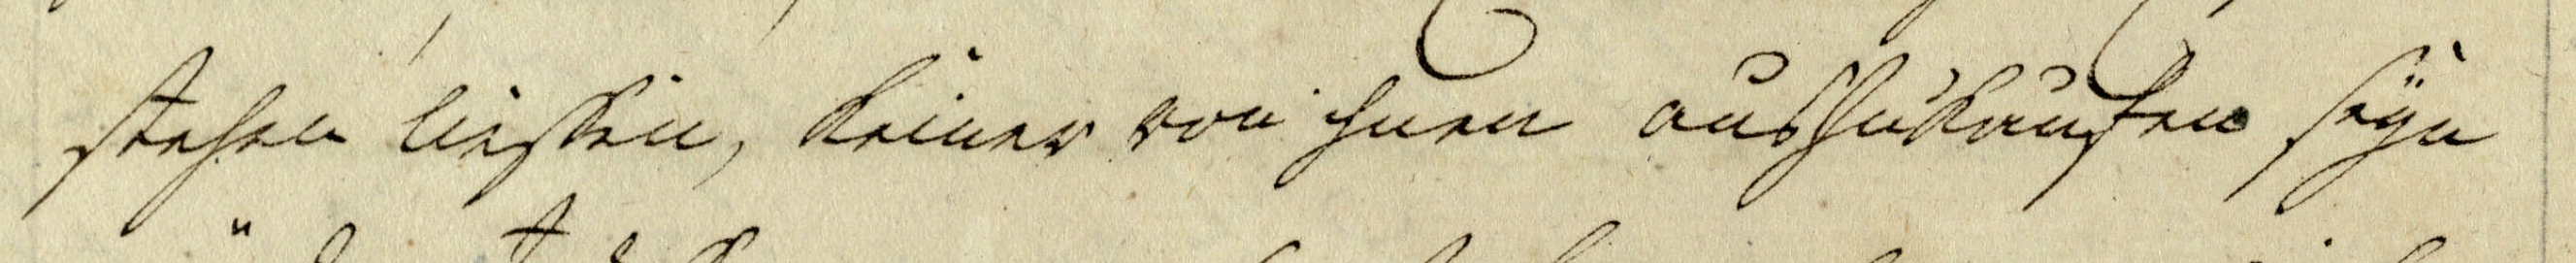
stehen liessen, keiner von ihnen auszukaufen seÿn
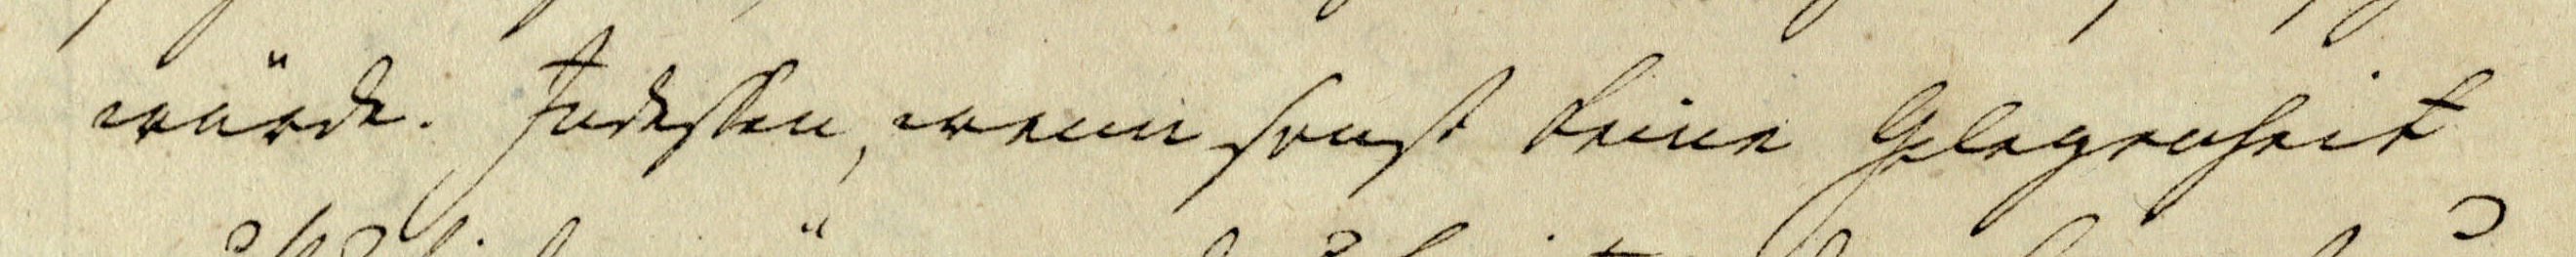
würde. Indessen, wenn sonst keine Gelegenheit
